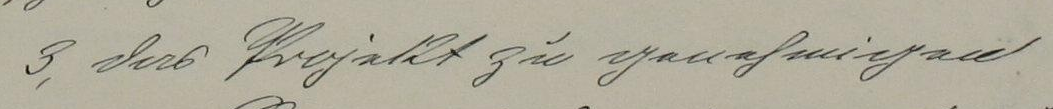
3. das Projekt zu genehmigen.
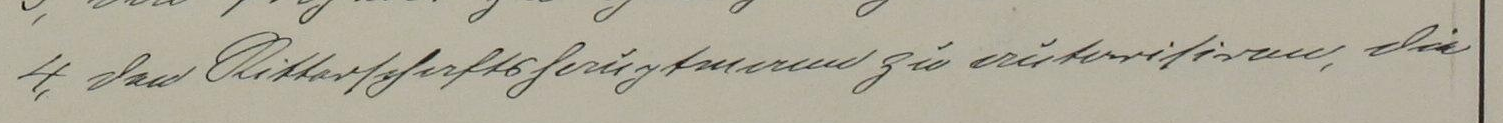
4. den Ritterschaftshauptmann zu autorisiren, die
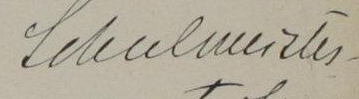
Schulmeister-
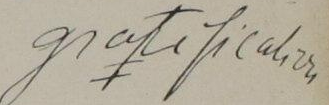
gratification
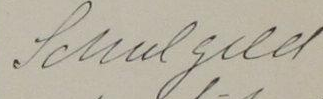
Schulgeld
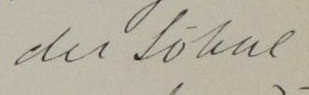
der Söhne
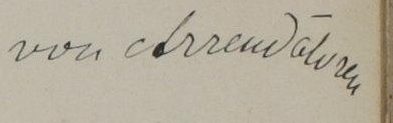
von Arrendatoren
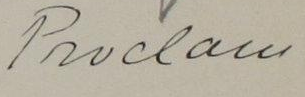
Proclam
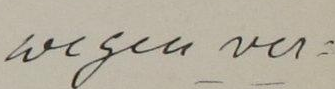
wegen ver-
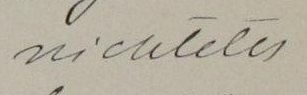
nichteter
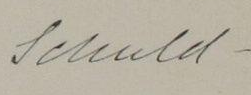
Schuld-
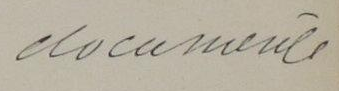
documente
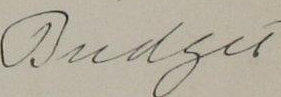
Budget
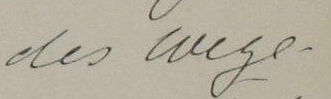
des Wege-
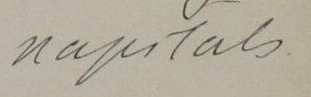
kapitals
